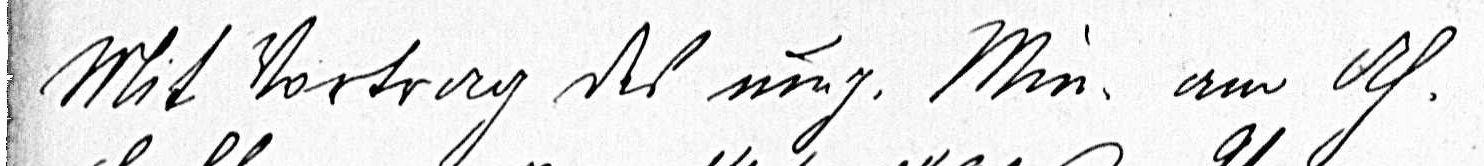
Mit Vortrag des ung. Min. am Ah.
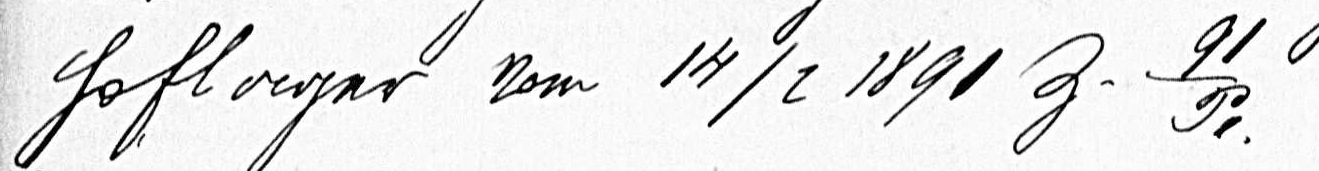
Hoflager vom 14/2 1890 Zl 91/Te
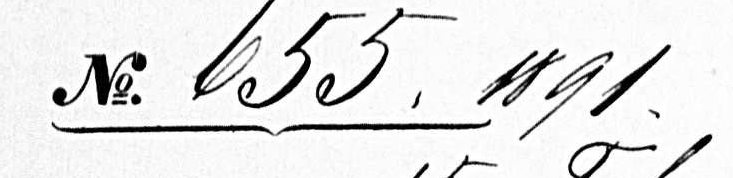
No. 655 – 1891
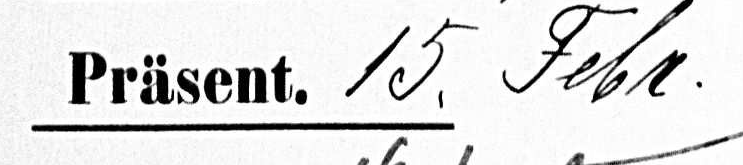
Präsent. 15. Febr
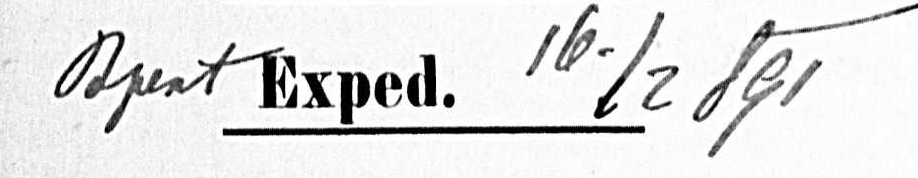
Bpest Expedit 16/2/1891
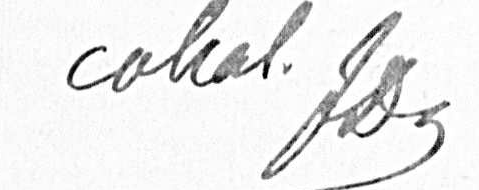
colcal
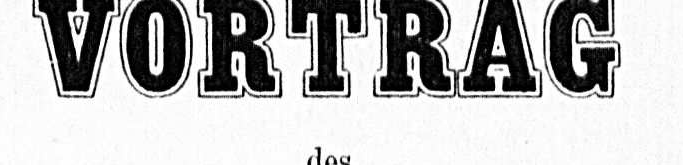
VORTRAG
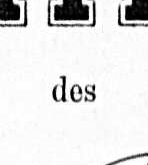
Des
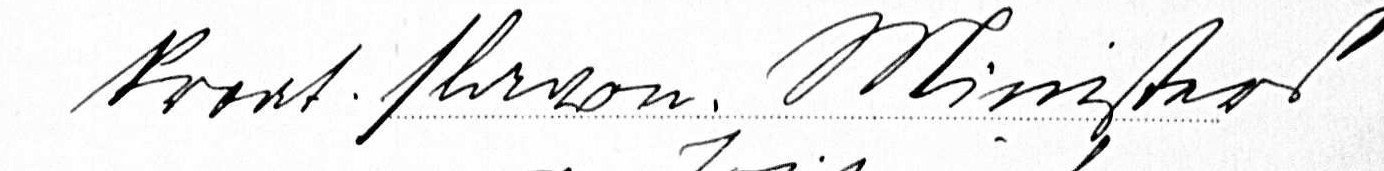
kroat. slavon. Ministers
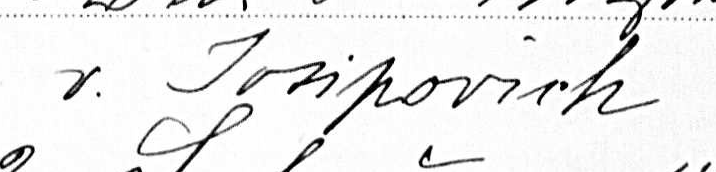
v. Josipovich
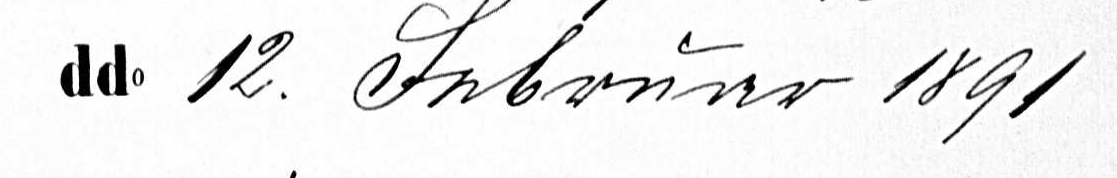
Ddo 12 Februar 1891
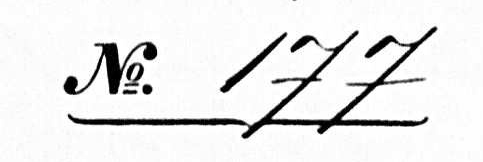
No 177
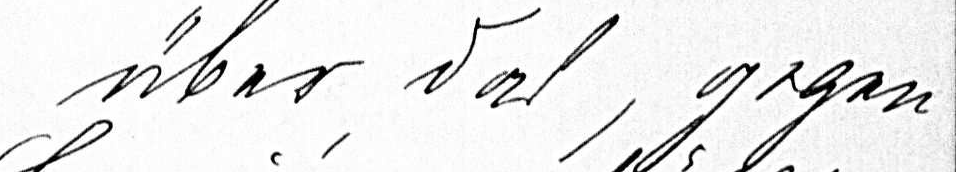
über das, gegen
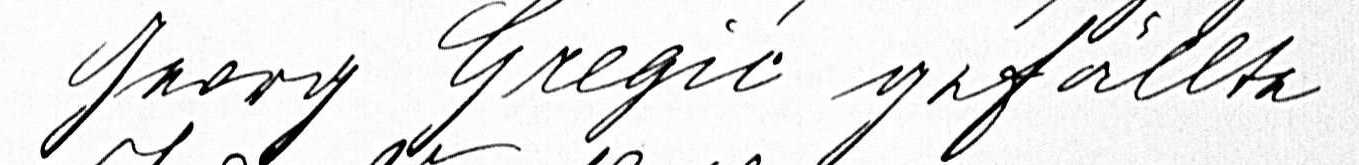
Georg Gregić gefällte
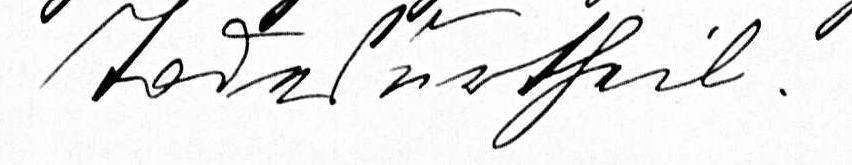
Todesurtheil.
